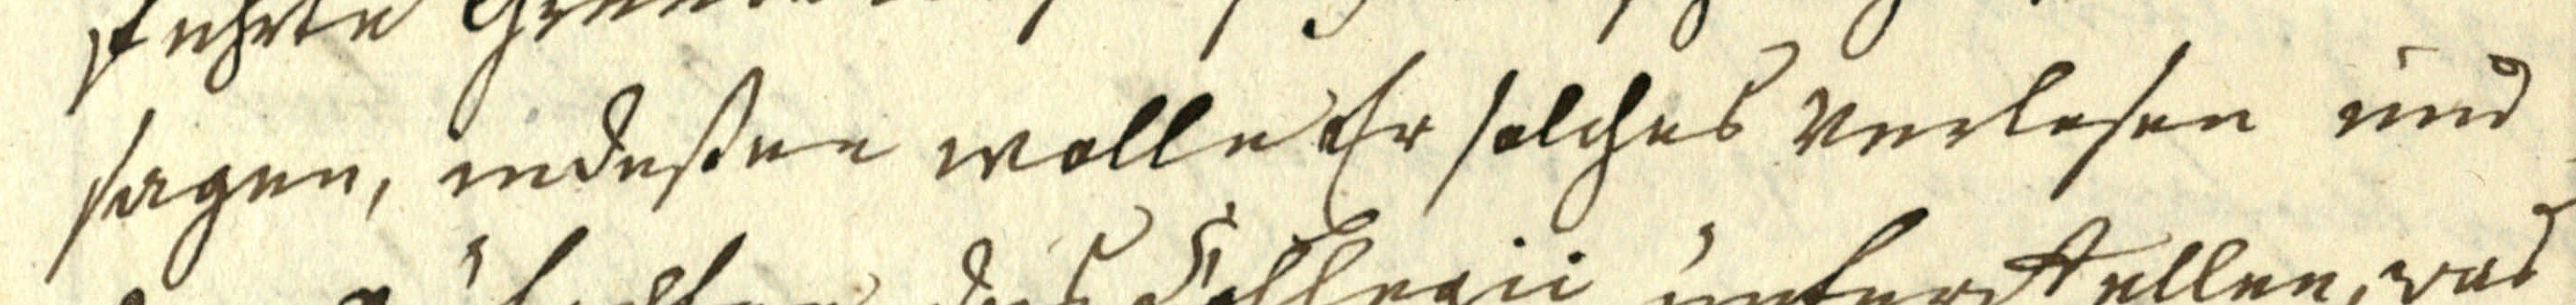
sagen, indeßen wolle Er solches verlesen und
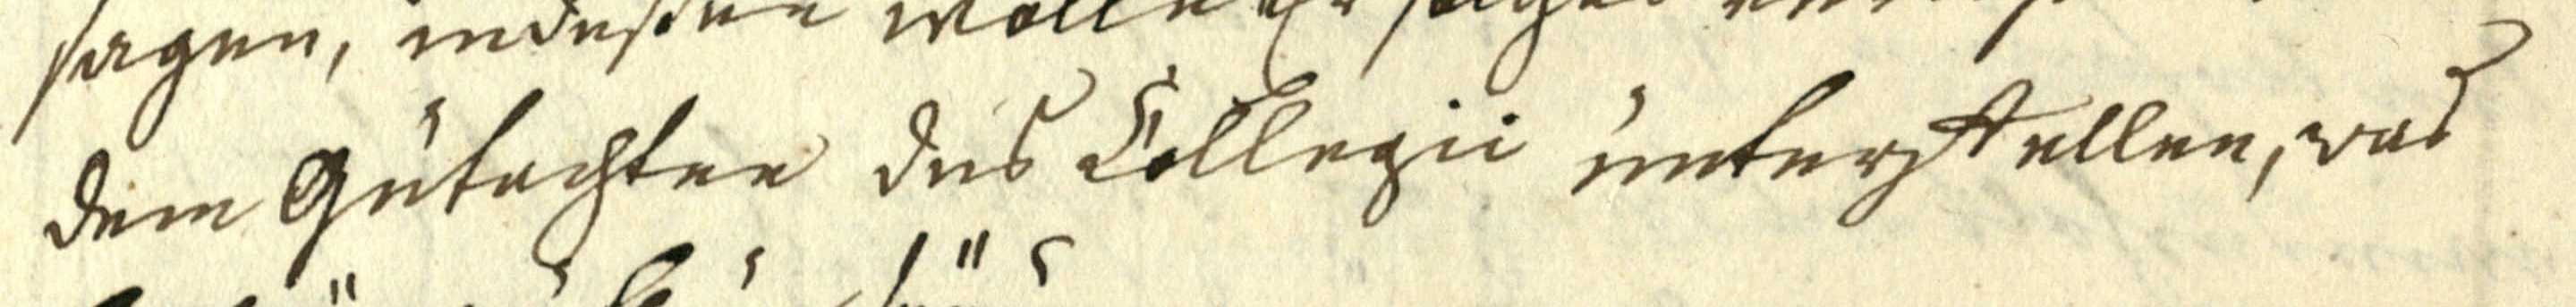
dem Gutachten des Collegii unterstellen, was
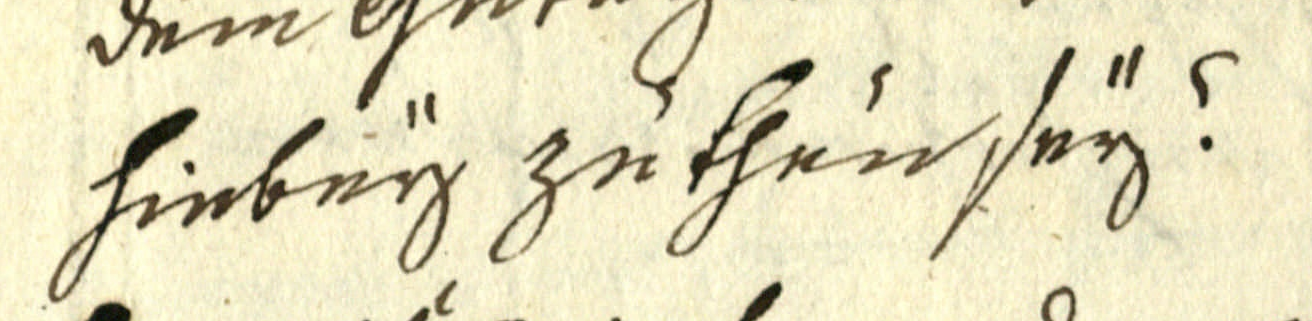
hiebeÿ zu thun seÿ?
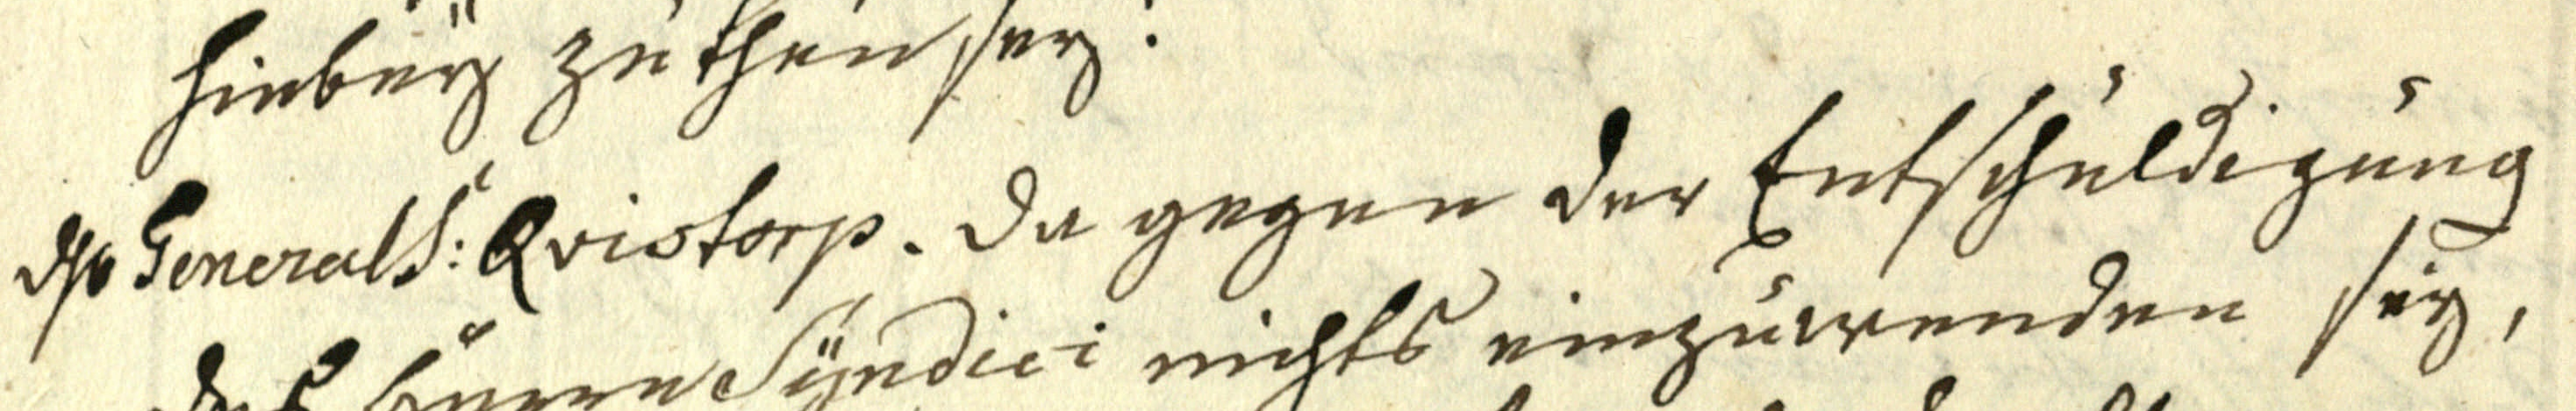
dh GeneralS. Quistorp. Da gegen der Entschuldigung
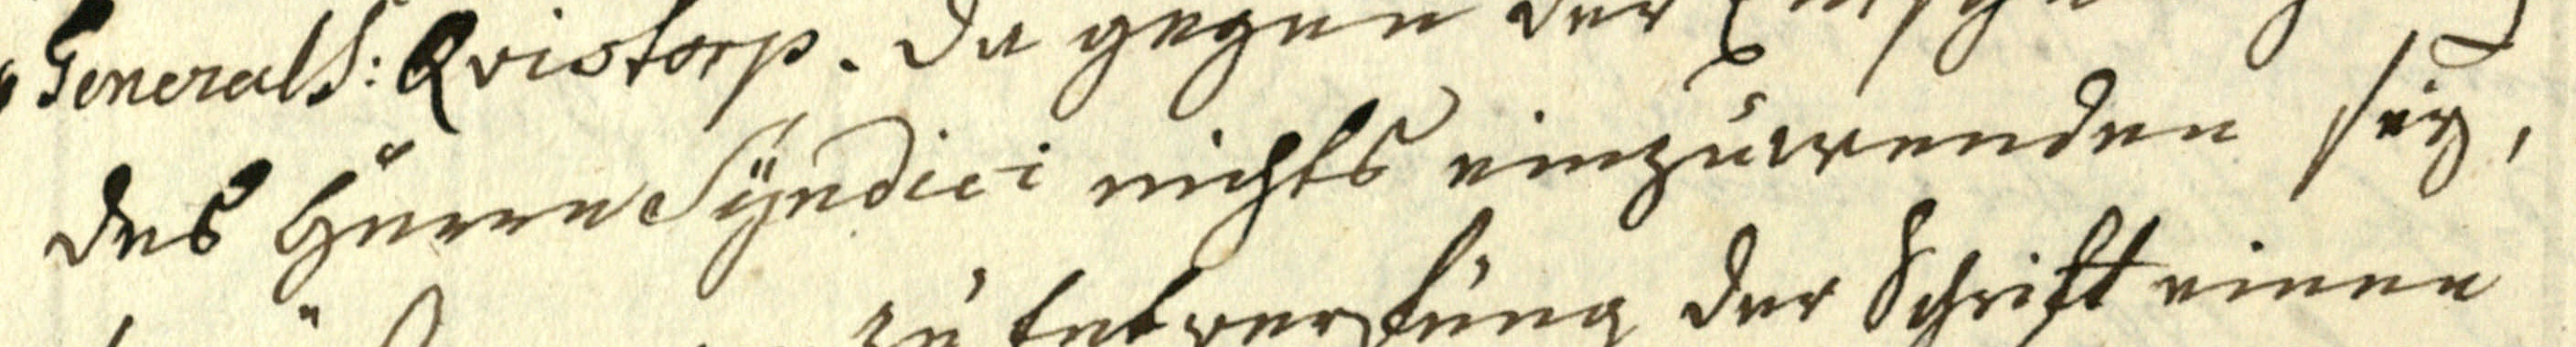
des Herrn Sÿndici nichts einzuwenden seÿ,
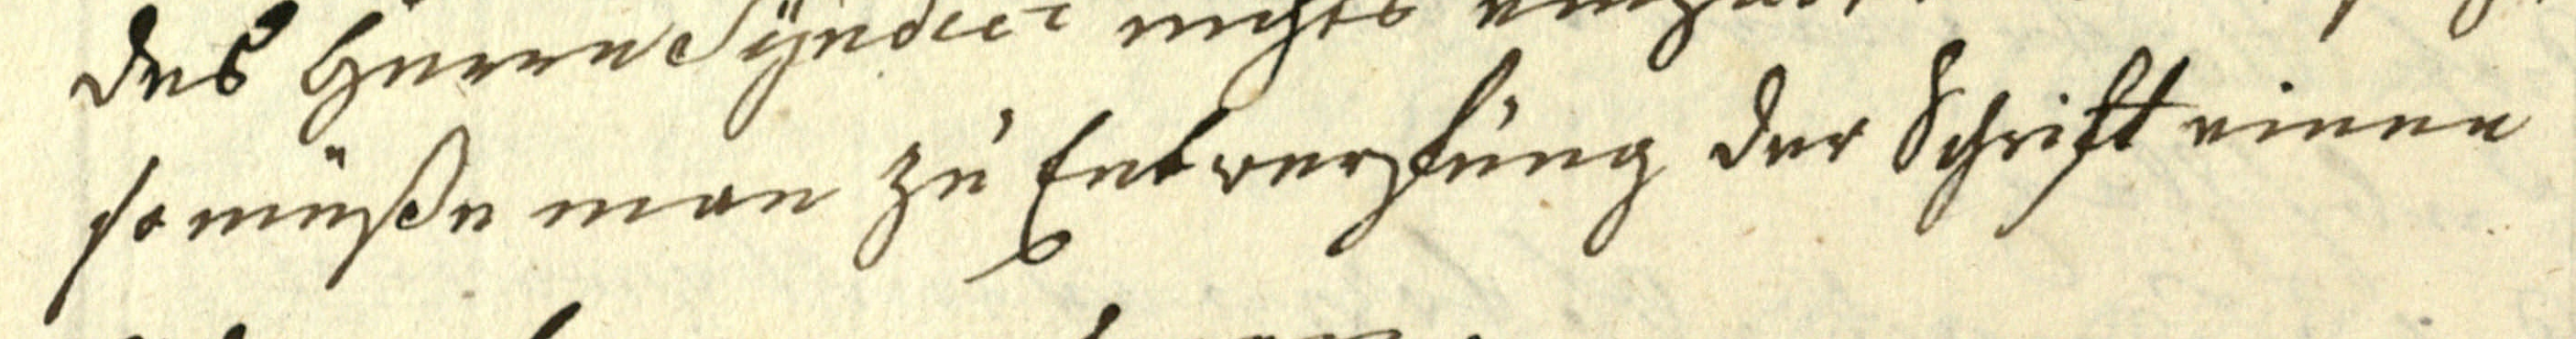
so müße man zu Entwerfung der Schrift einen
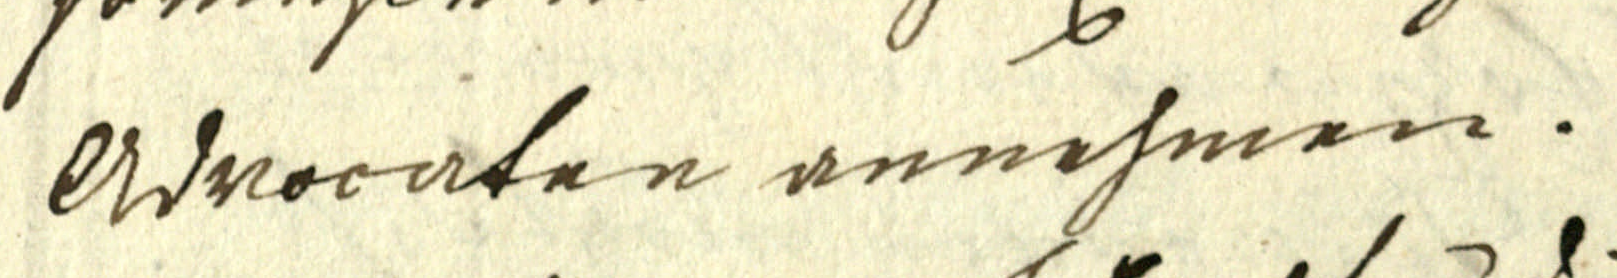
Advocaten annehmen.
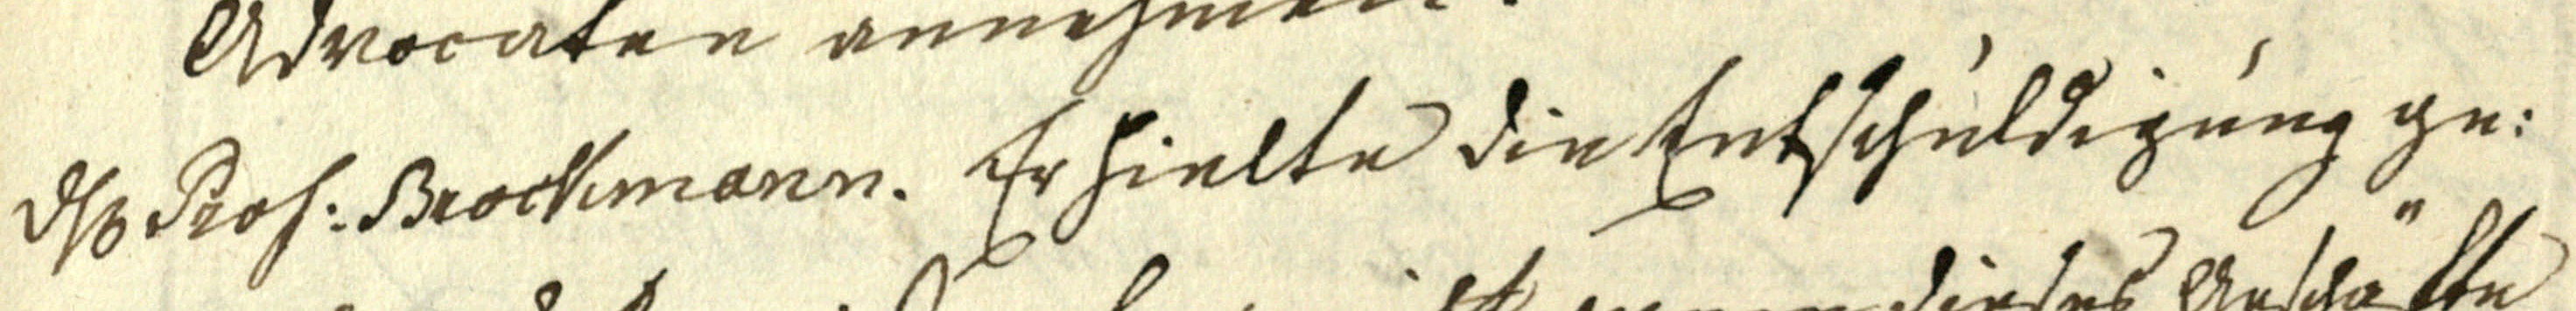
dh Prof. Brockmann. Er hielte die Entschuldigung ge¬
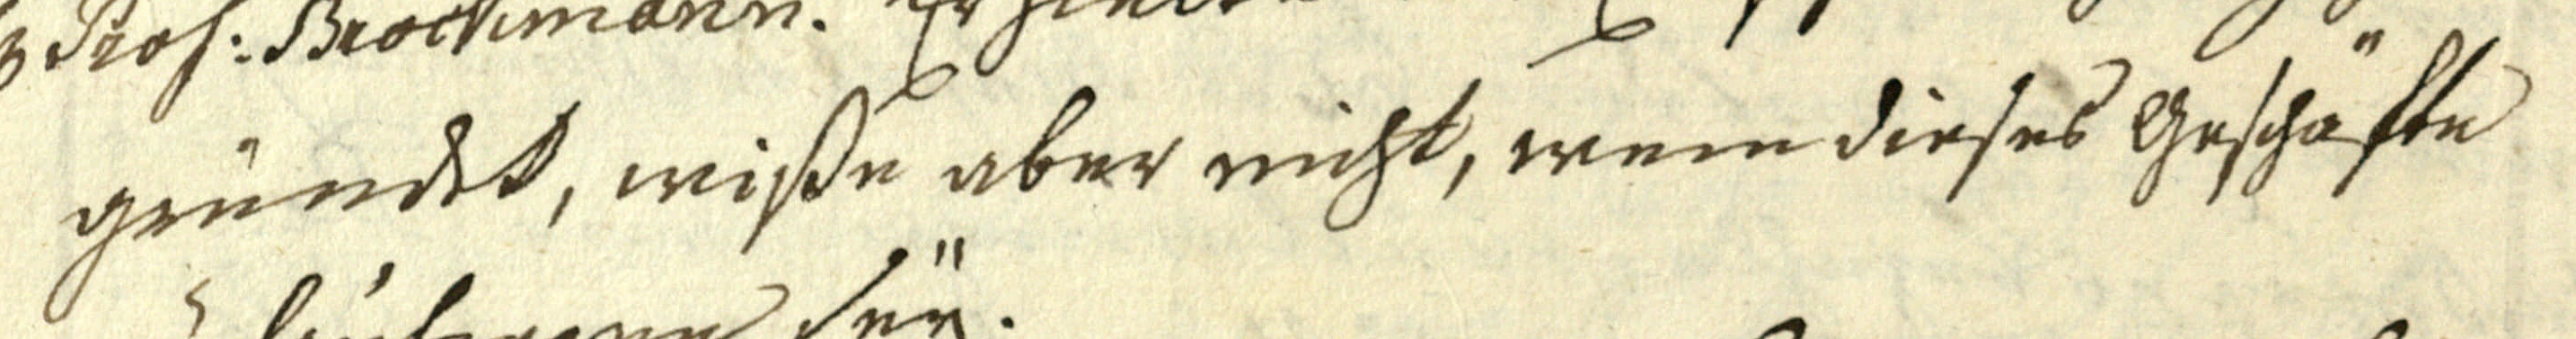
gründet, wiße aber nicht, wenn dieses Geschäfte
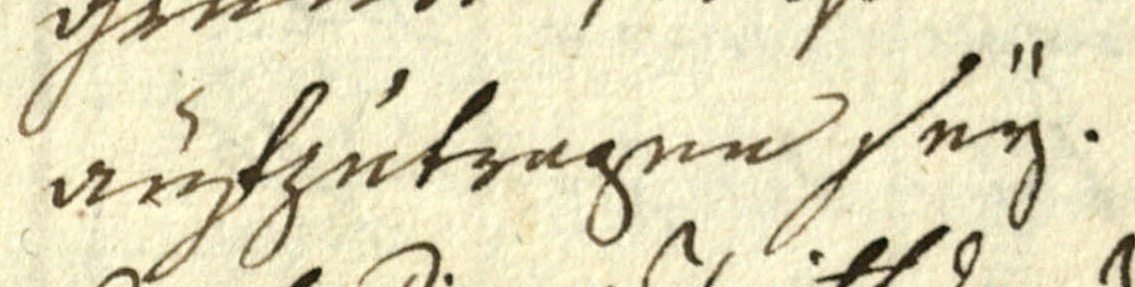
aufzutragen seÿ.
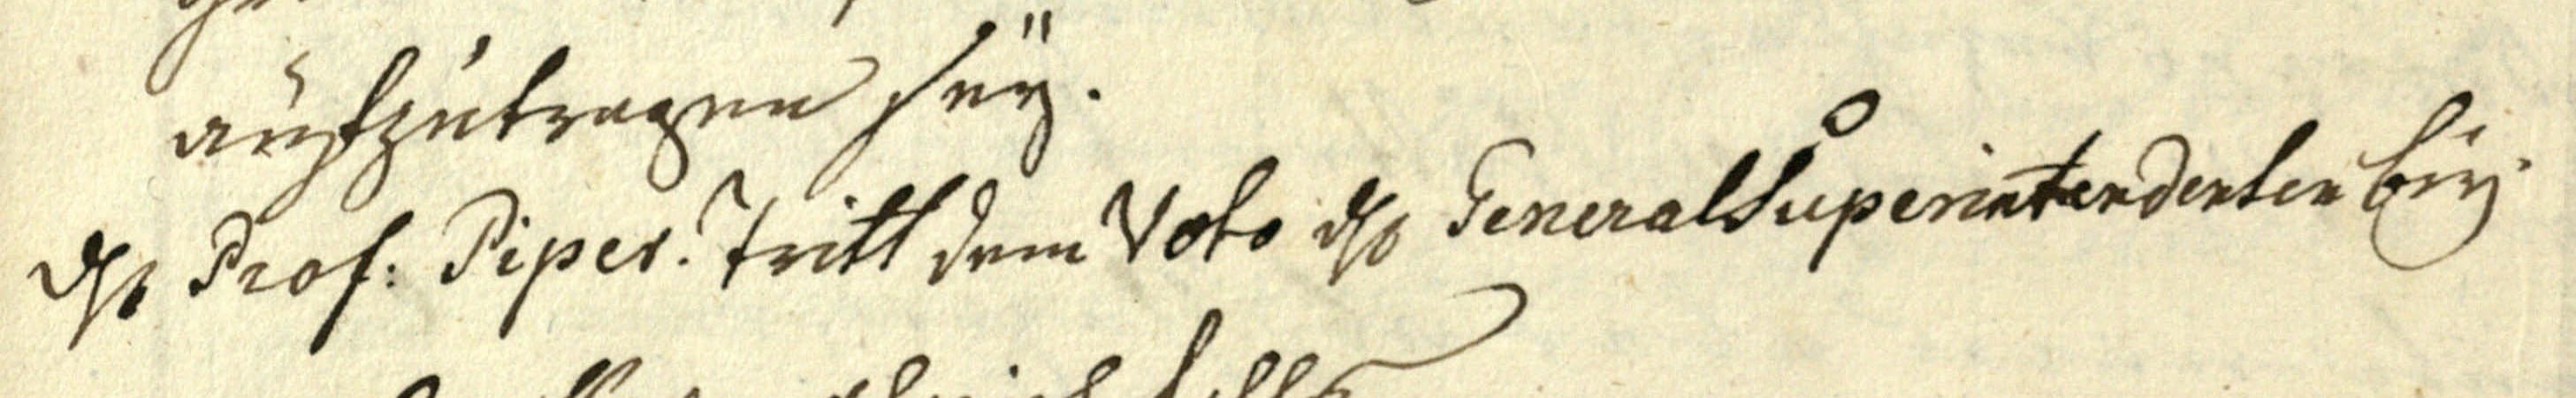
dh Prof. Piper. Tritt dem Voto dh GeneralSuperintendenten beÿ.
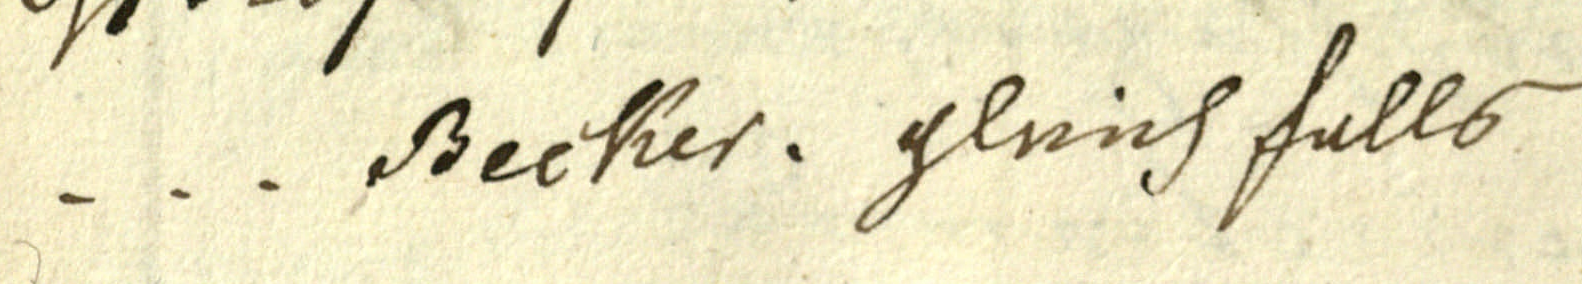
Becker. gleich falls
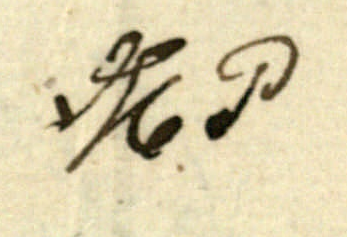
dh P
